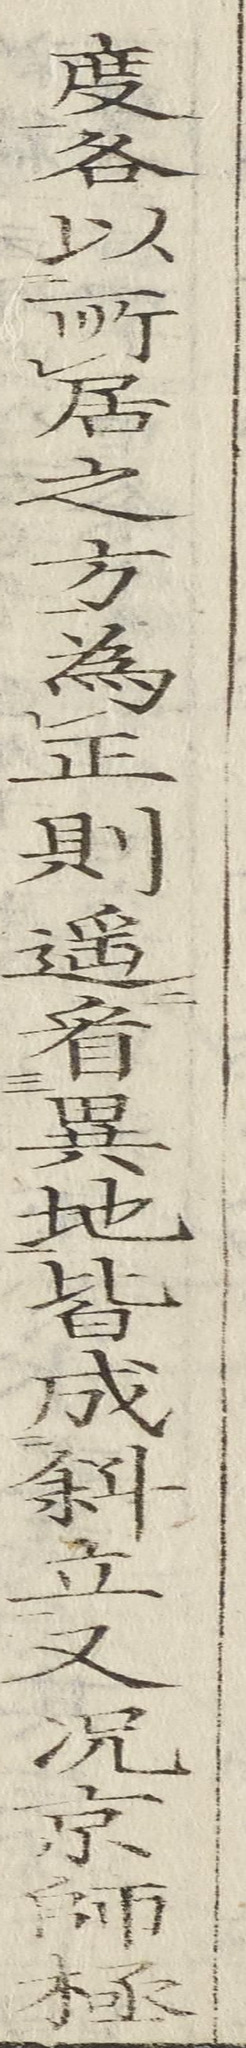度各以ニ所居之方爲正則遙看異地皆成ニ斜立又況京師極
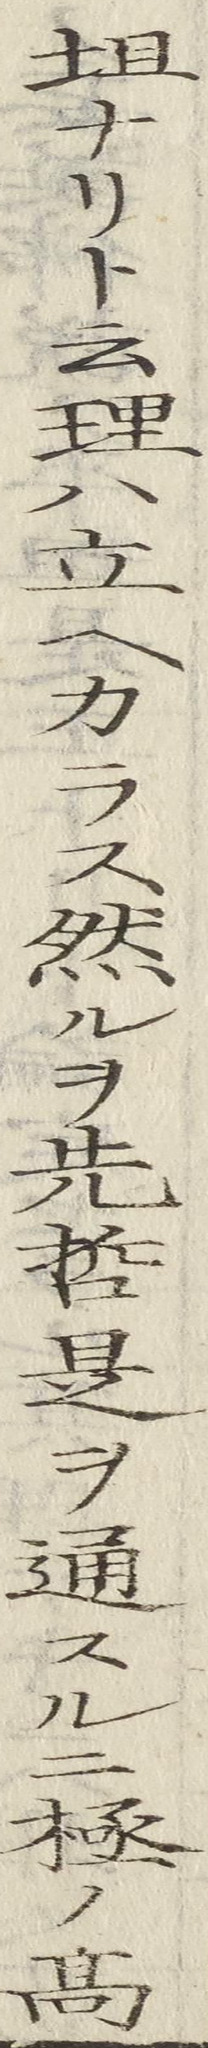坦ナリト云理ハ立ヘカラス然ルヲ先哲是ヲ通スルニ極ノ高
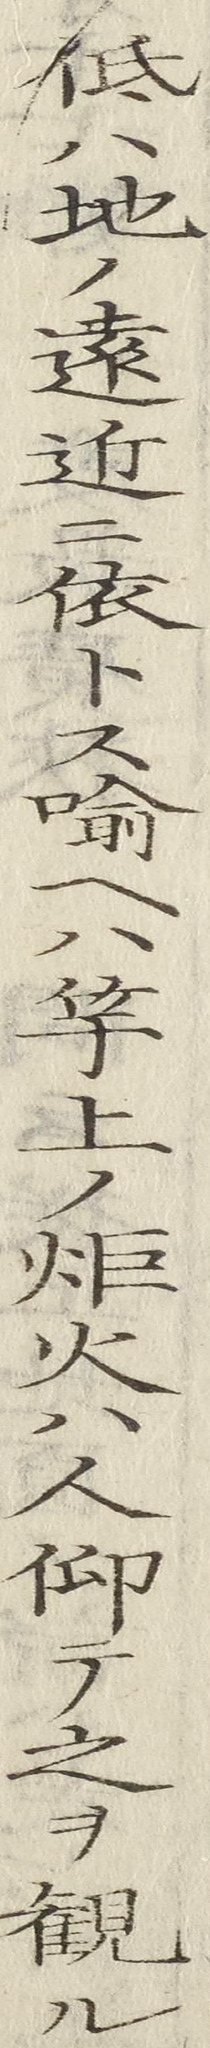低ハ地ノ遠近ニ依トス喩ヘハ竿上ノ炬火ハ人仰テ之ヲ観ル
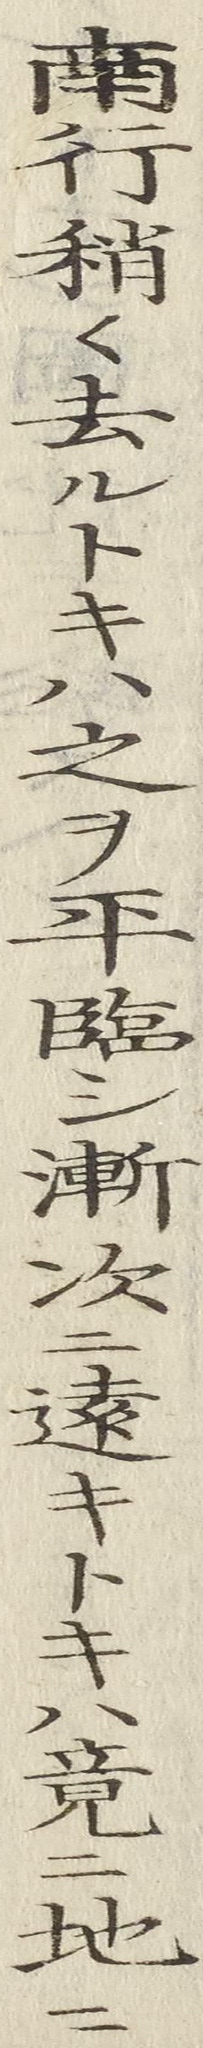南行稍く去ルトキハ之ヲ平臨シ漸次ニ遠キトキハ竟ニ地ニ
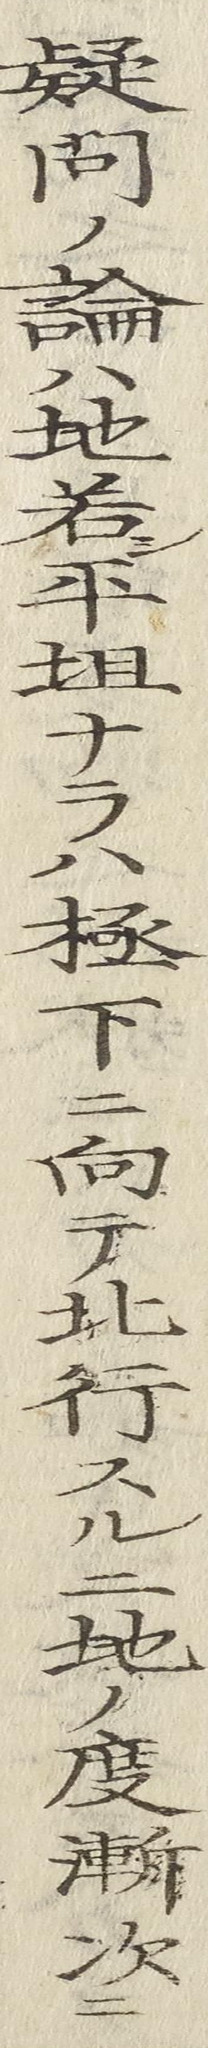疑問ノ論ハ地若平坦ナラハ極下ニ向テ北行スルニ地ノ度漸次ニ
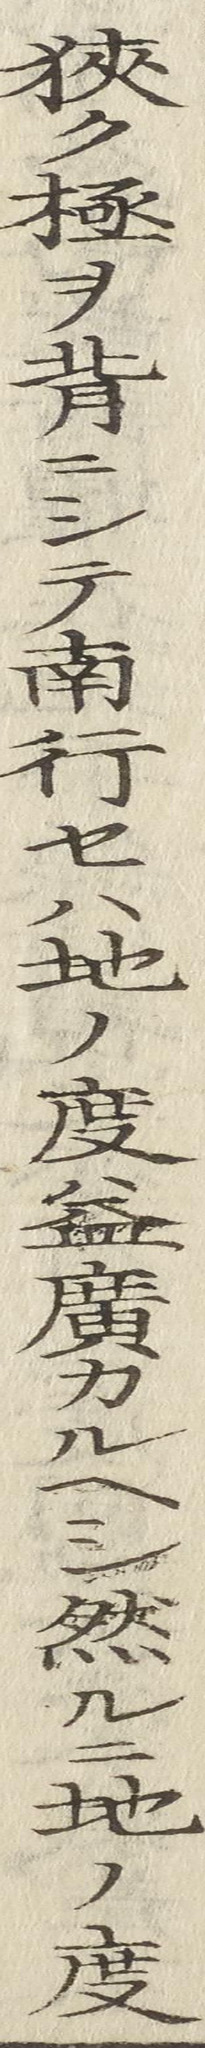狭ク極ヲ背ニシテ南行セハ地ノ度益広カルヘシ然ルニ地ノ度
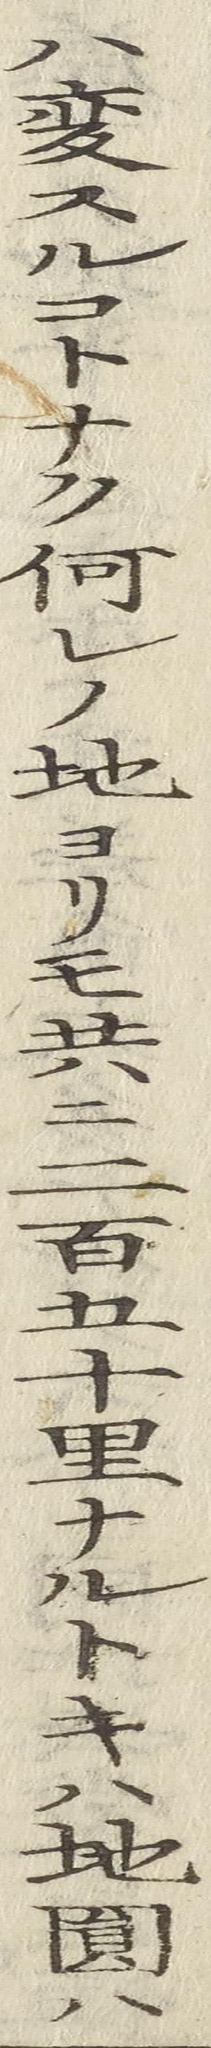ハ変スルコトナク何レノ地ヨリモ共ニ二百五十里ナルトキハ地円ハ
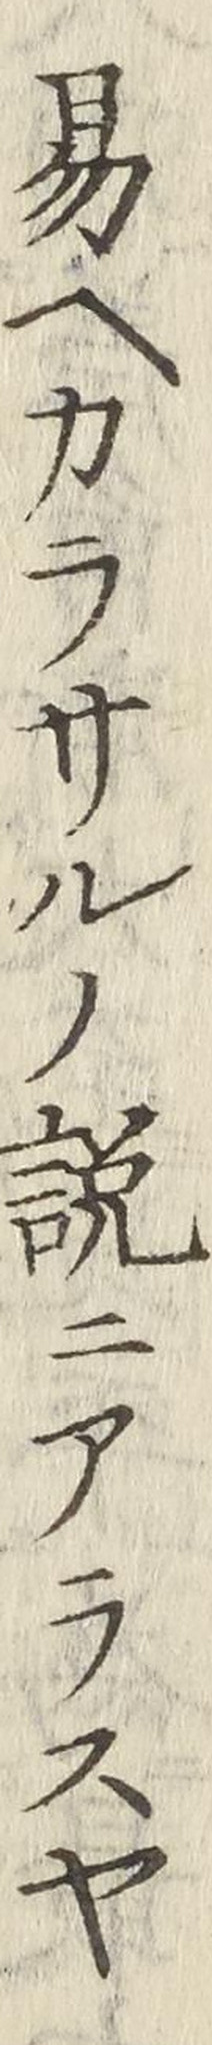易ヘカラサルノ説ニアラスヤ
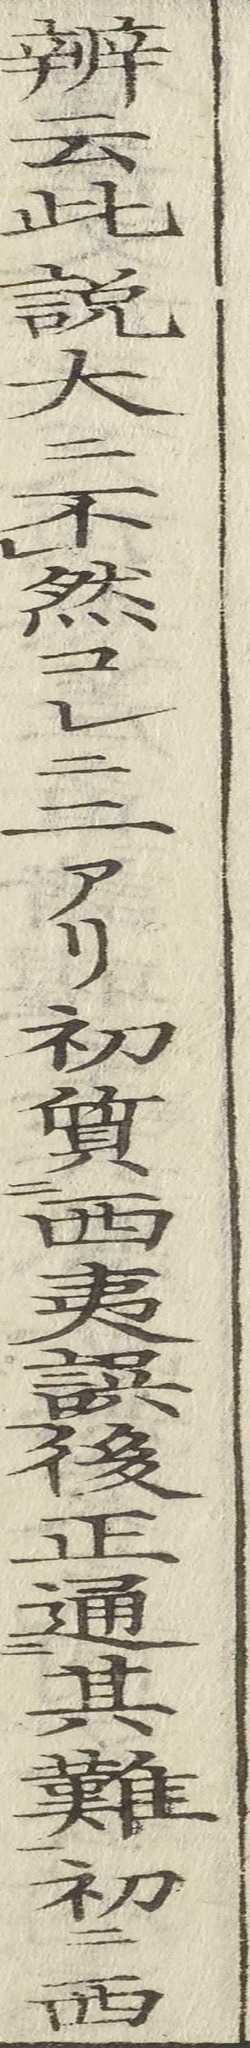弁云此説大ニ不然コレニニアリ初質ニ西夷誤後正通ニ其難初ニ西
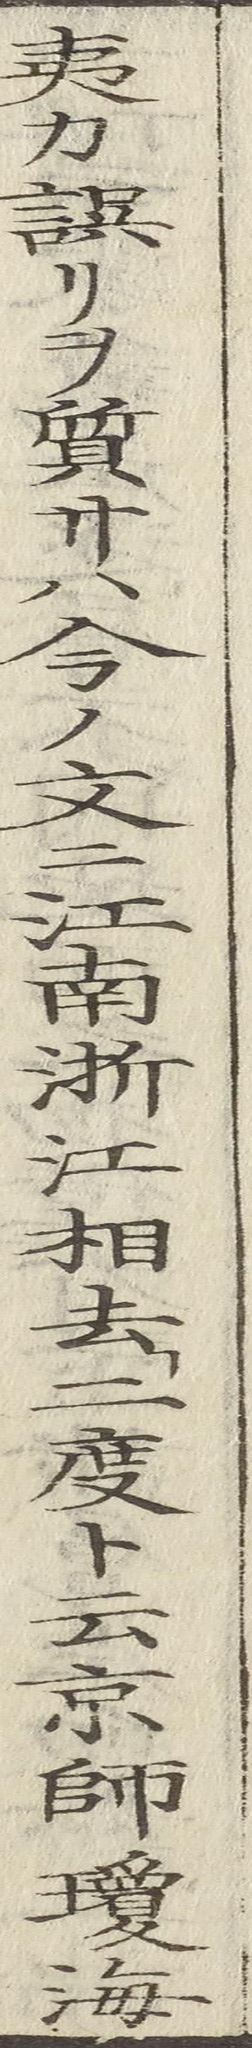夷カ誤リヲ質サハ今ノ文ニ江南浙江相去度ト云京師瓊海
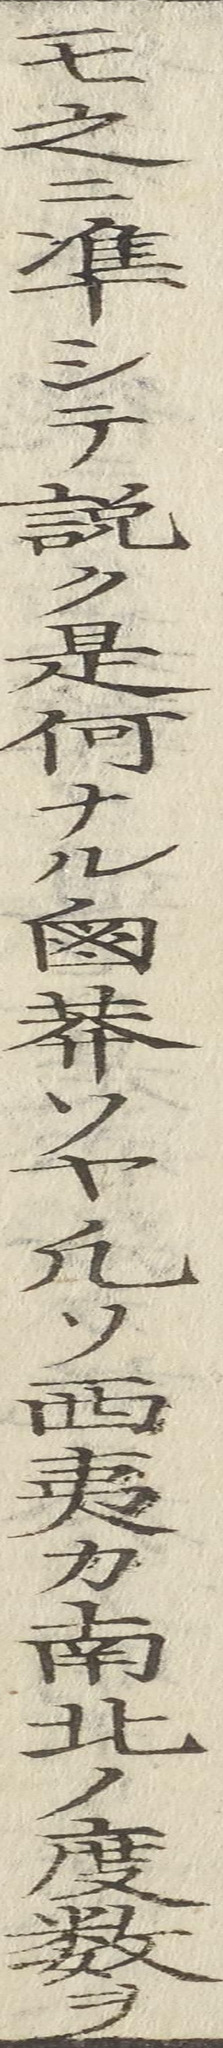モ之ニ準シテ説ク是何ナル鹵莽ソヤ凡ソ西夷カ南北ノ度数ヲ
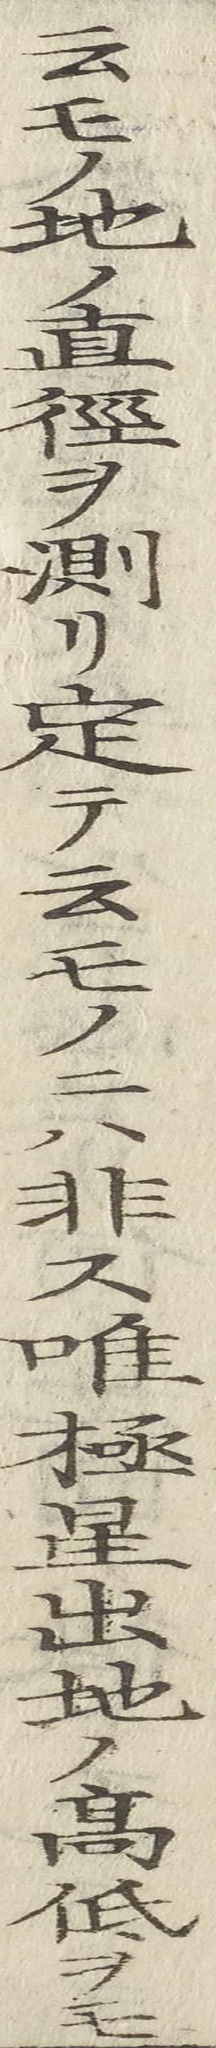云モノ地ノ直径ヲ測リ定テ云モノニハ非ス唯極星出地ノ高低ヲモ
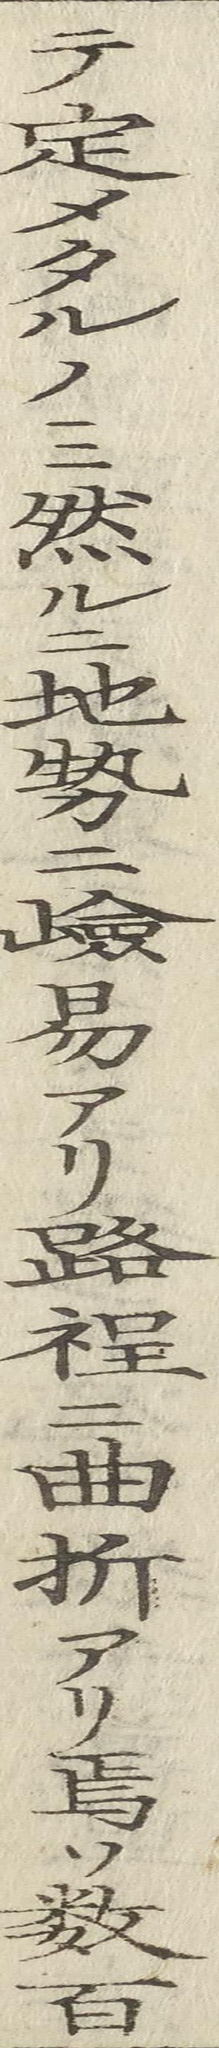テ定メタルノミ然ルニ地勢ニ嶮易アリ路程ニ曲折アリ焉ソ数百

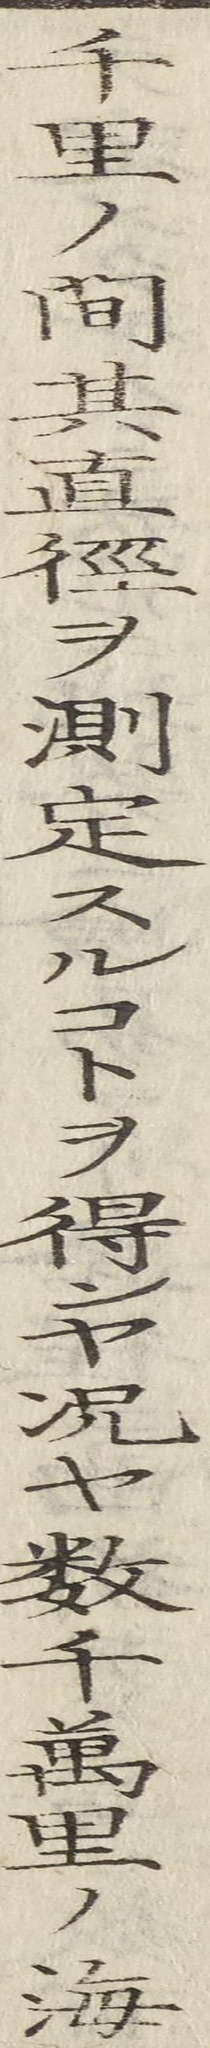千里ノ間其直径ヲ測定スルコトヲ得ンヤ況ヤ数千万里ノ海
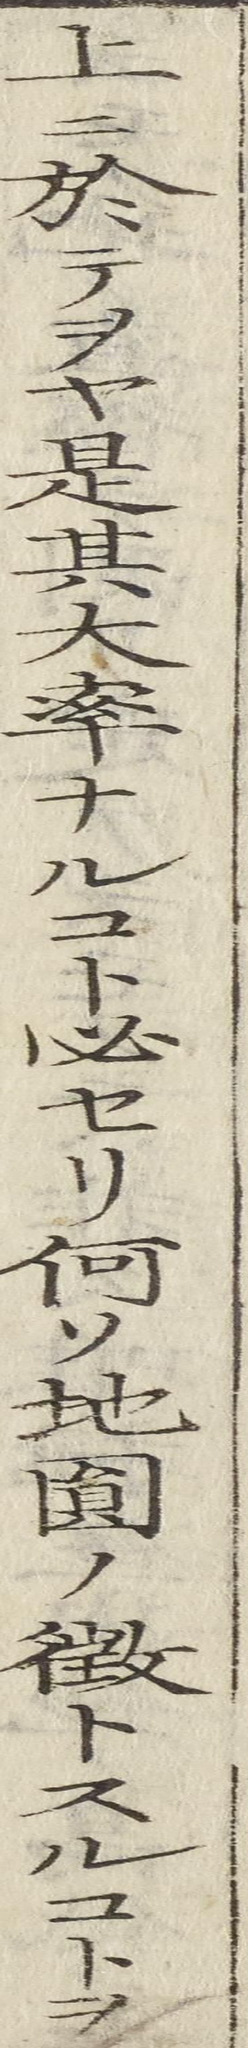上ニ於テヲヤ是其大率ナルコト必セリ何ソ地円ノ徴トスルコトヲ
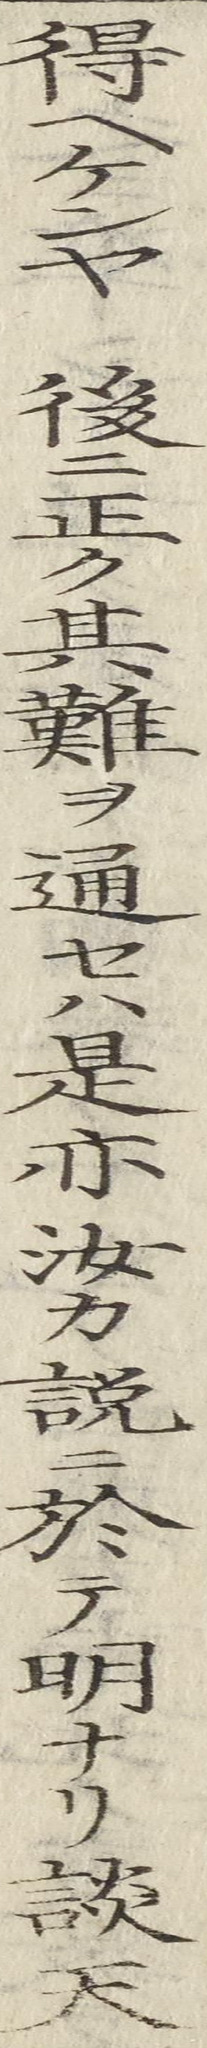得ヘケンヤ後ニ正ク其難ヲ通セハ是亦汝カ説ニ於テ明ナリ談天
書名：護法新論　二編　中
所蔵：東京大学地震研究所図書室 Earthquake Research Institute Library, The University of Tokyo, JAPAN
